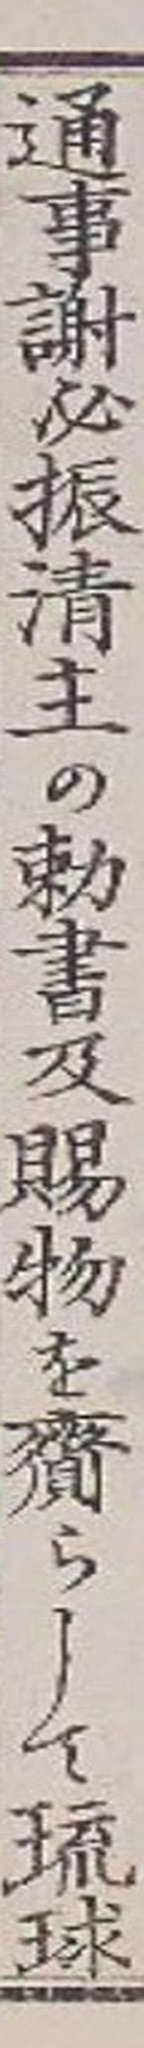通事謝必振清主の勅書及賜物を齎らして琉球
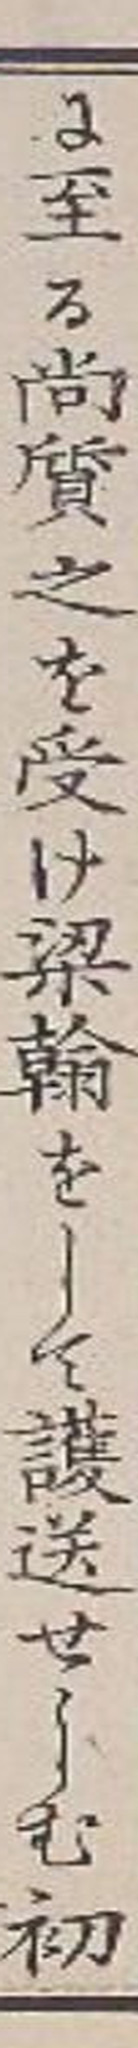に至る尚質之を受け梁翰をして護送せしむ初
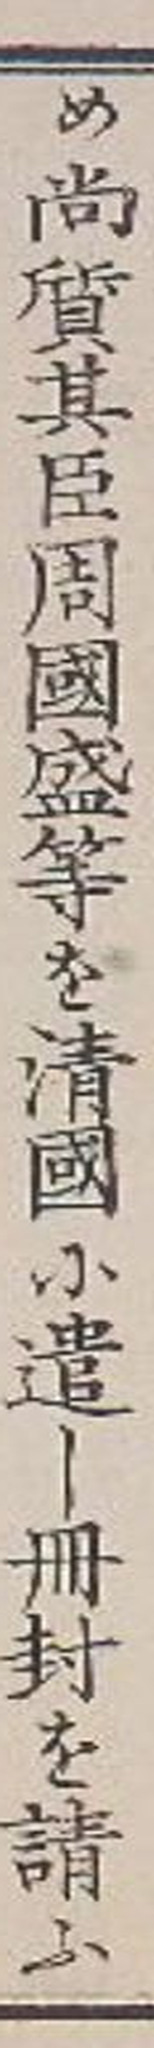め尚質其臣周国盛等を清国に遣し冊封を請ふ
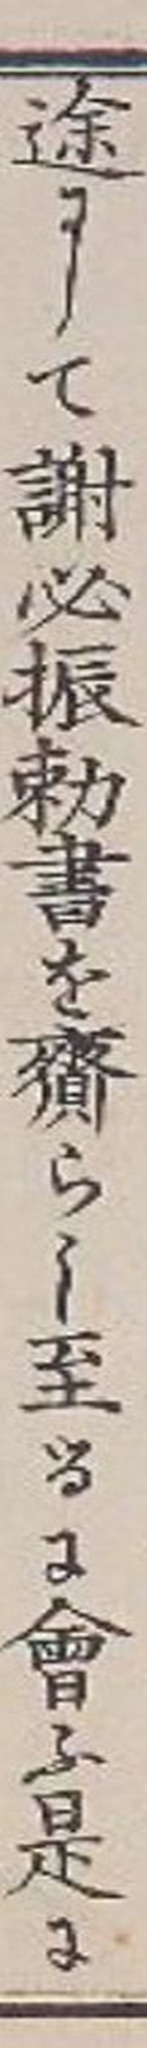途にして謝必振勅書を齎らし至るに会ふ是に
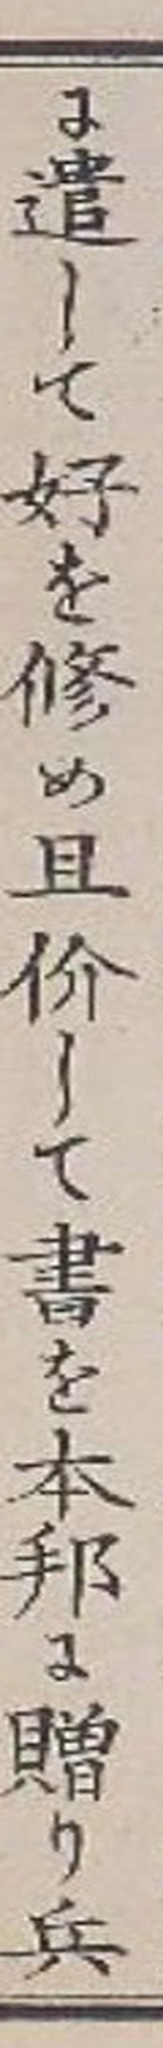に遣して好を修め且价して書を本邦に贈り兵
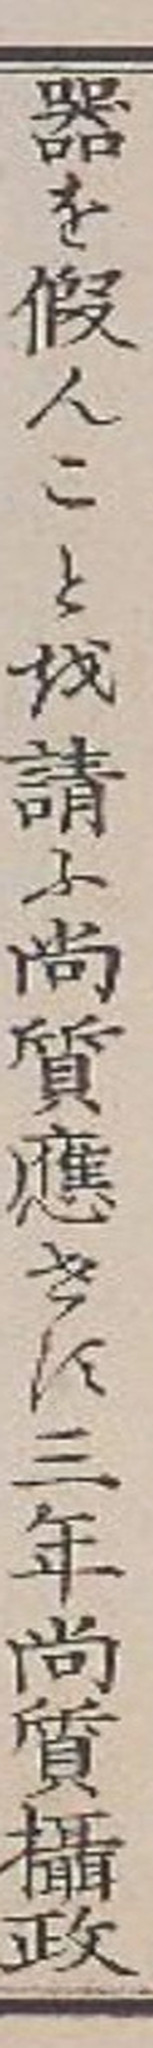器を仮んことを請ふ尚質応せす三年尚質摂政
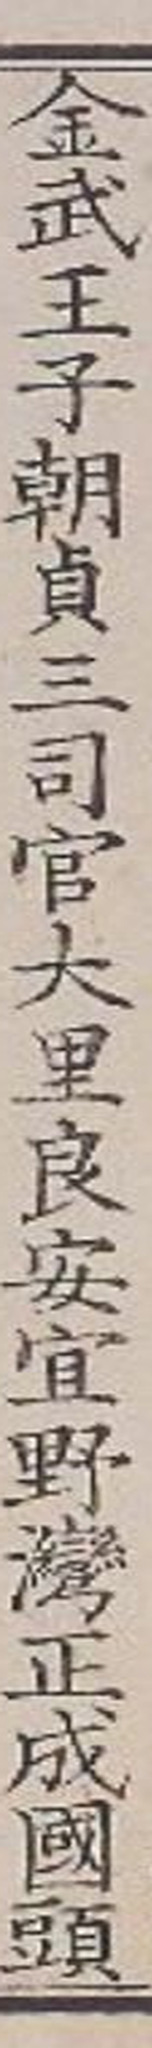金武王子朝貞三司官大里良安宜野湾正成国頭
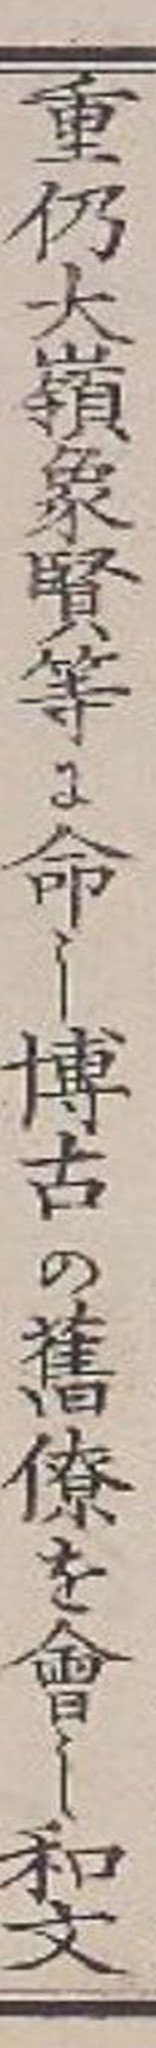重仍大嶺象賢等に命し博古の旧僚を会し和文
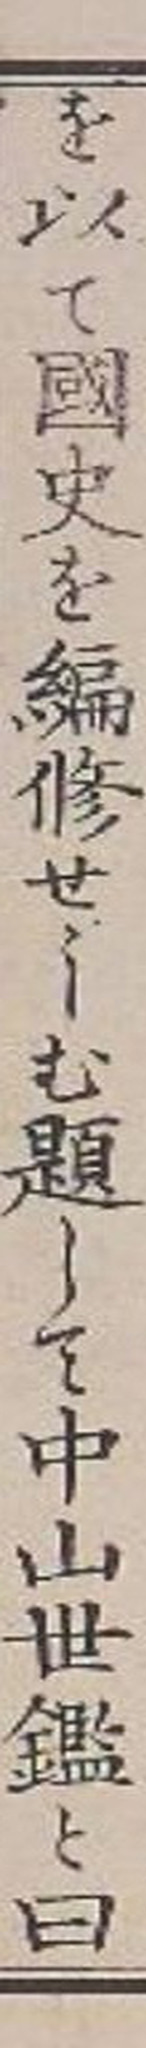を以て国史を編修せしむ題して中山世鑑と曰

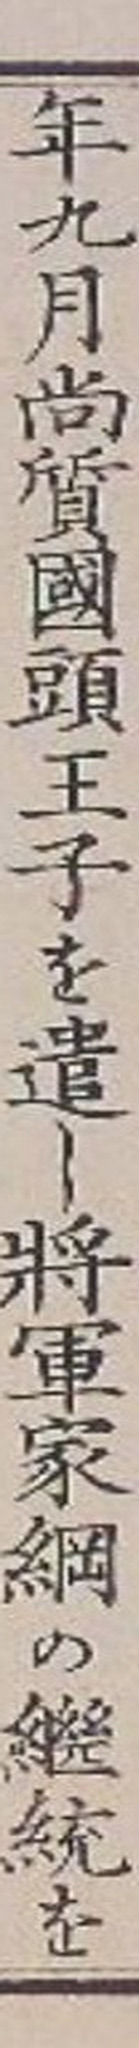年九月尚質国頭王子を遣し将軍家綱の継統を
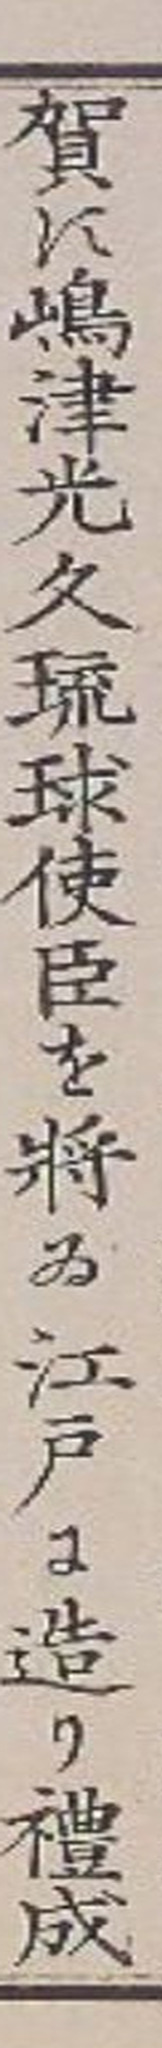賀す島津光久琉球使臣を将ゐ江戸に造り礼成
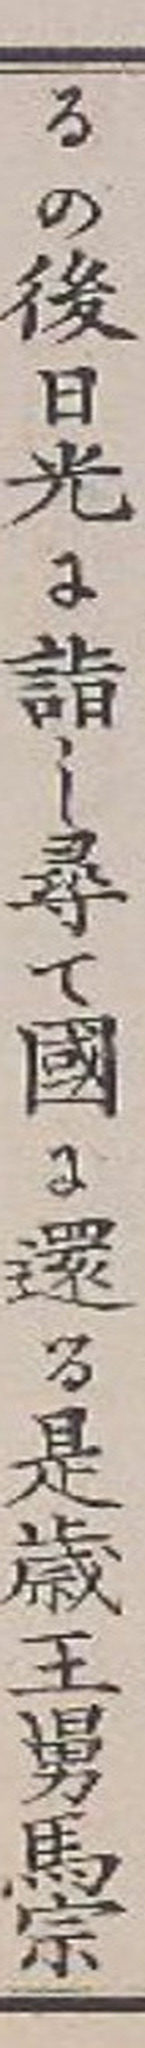るの後日光に詣し尋て国に還る是歳王舅馬宗
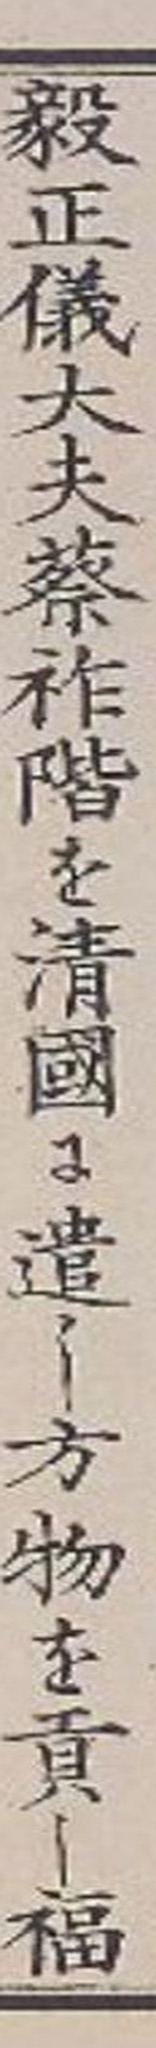毅正儀大夫蔡柞階を清国に遣し方物を貢し福
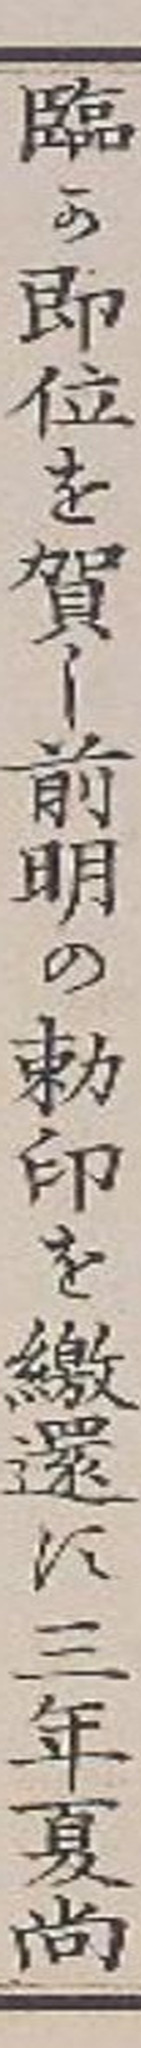臨か即位を賀し前明の勅印を繳還す三年夏尚
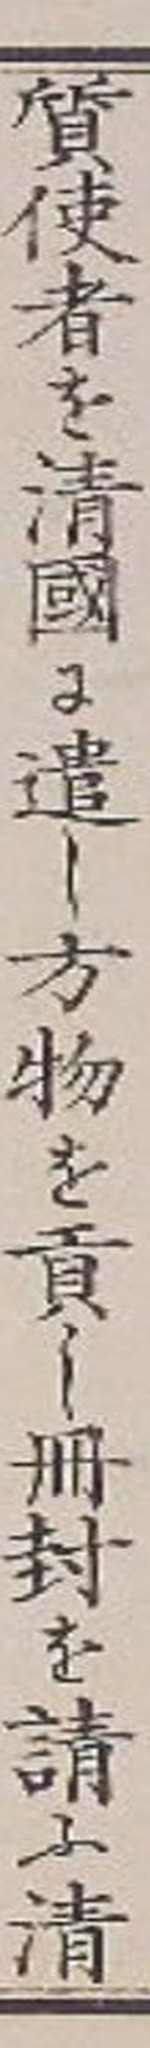質使者を清国に遣し方物を貢し冊封を請ふ清
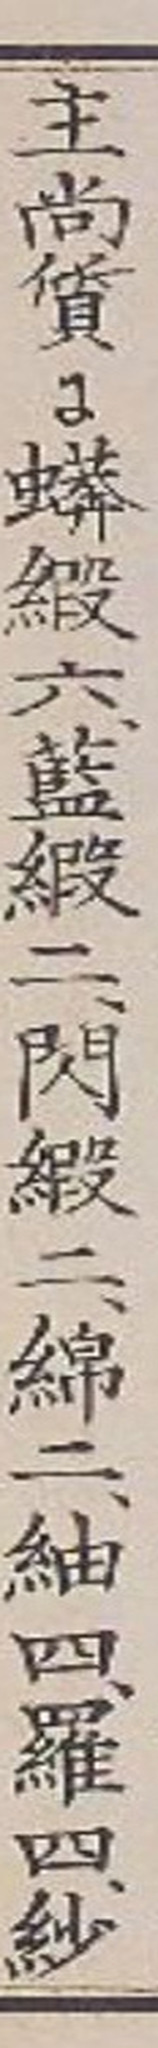主尚質に蠎縀六、藍縀二、閃縀二、綿二、紬四、羅四、紗
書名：南島紀事 下
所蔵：University of the Ryukyus Library
